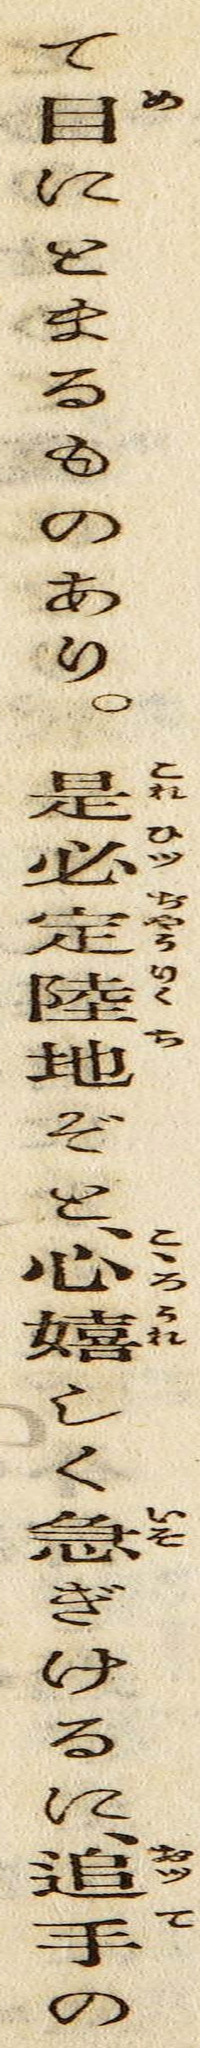て目にとまるものあり。是必定陸地ぞと、心嬉しく急ぎけるに、追手の
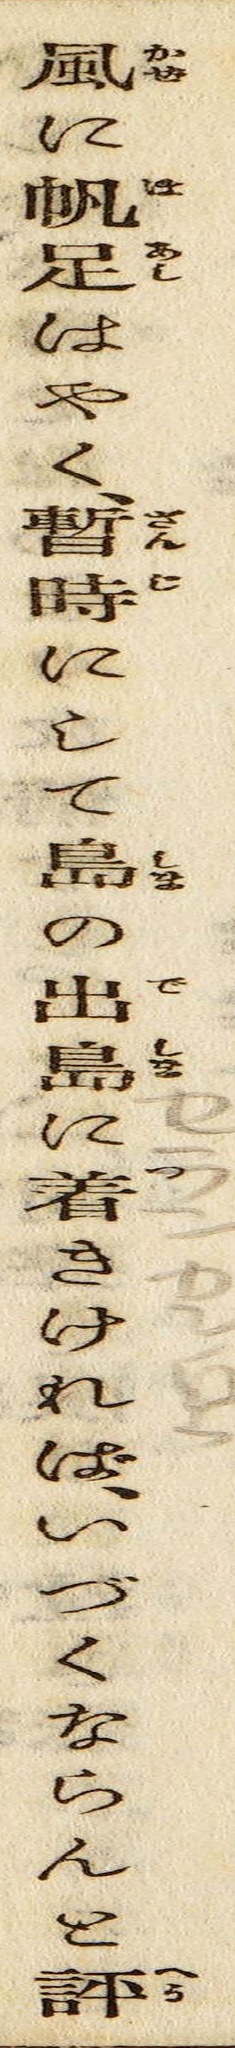風に帆足はやく、暫時にして島の出島に着きければ、いづくならんと評
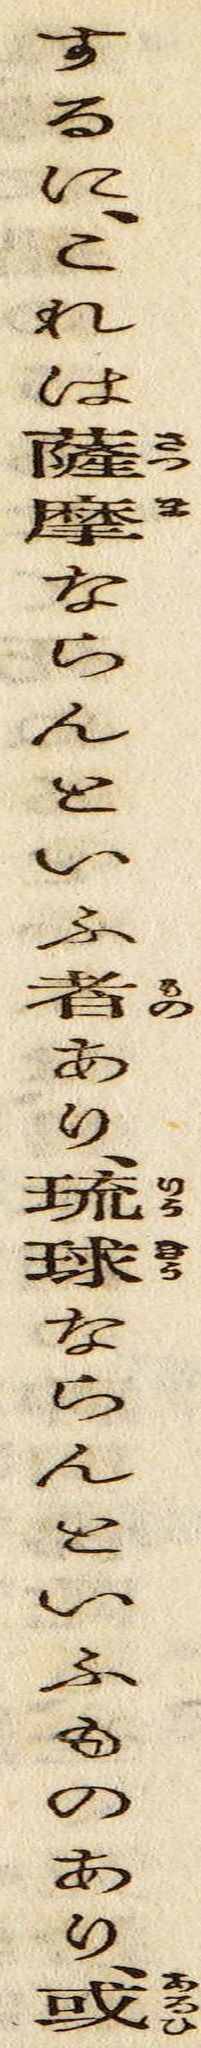するに、これは薩摩ならんといふ者あり、琉球ならんといふものあり、或
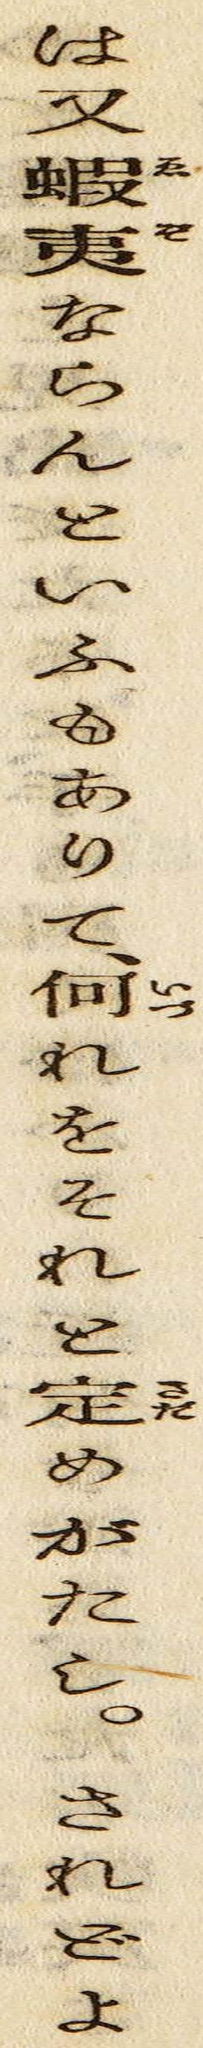は又蝦夷ならんといふもありて、何れをそれと定めがたし。されどよ
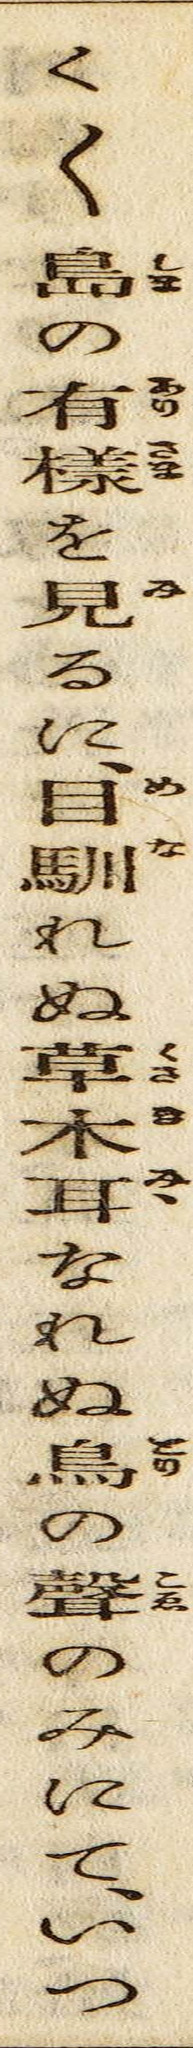く〳〵島の有様を見るに、目馴れぬ草木耳なれぬ鳥の声のみにて、いつ
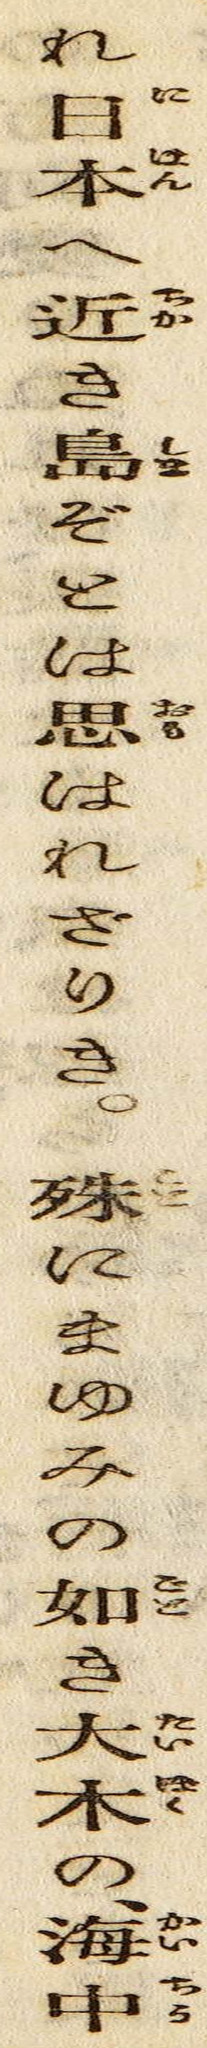れ日本へ近き島ぞとは思はれざりき。殊にまゆみの如き大木の、海中
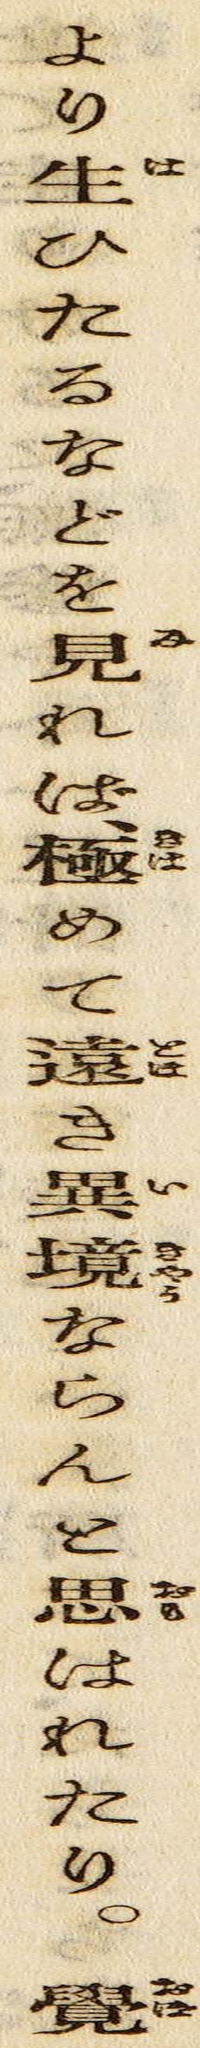より生ひたるなどを見れば、極めて遠き異郷ならんと思はれたり。覚
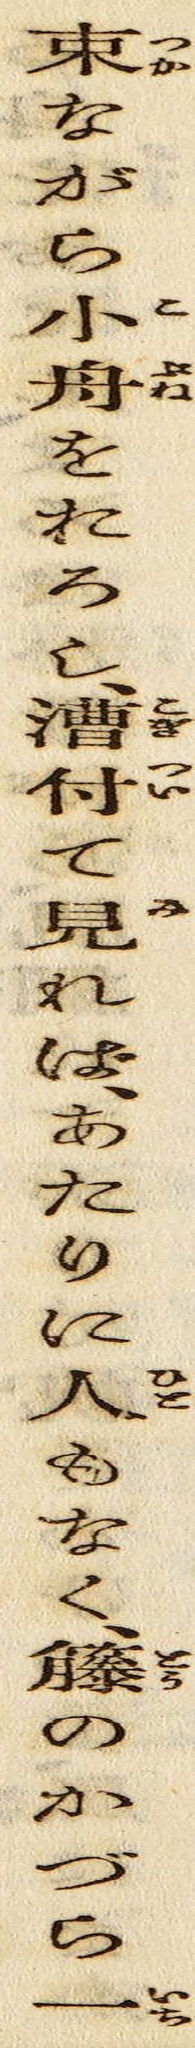束ながら小舟をおろし、漕付て見れば、あたりに人もなく、籐のかづら一
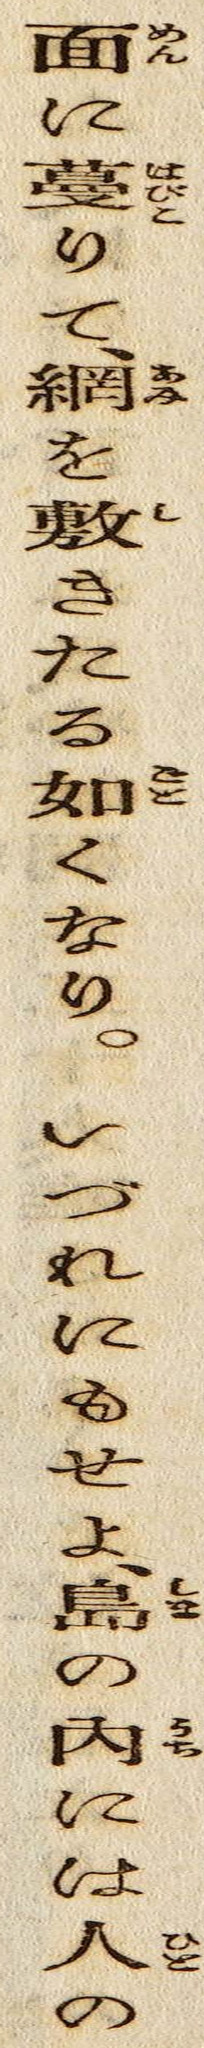面に蔓りて、網を敷きたる如くなり。いづれにもせよ、島の内には人の
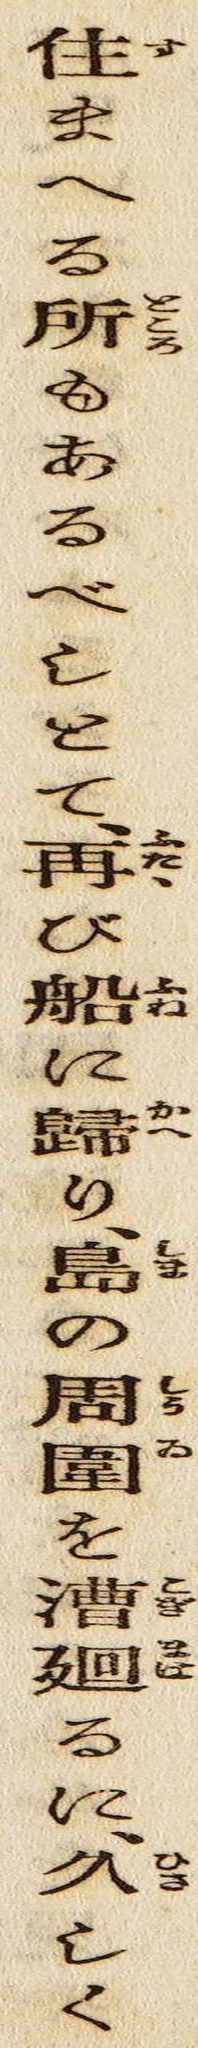住まへる所もあるべしとて、再び船に帰り、島の周囲を漕廻るに、久しく
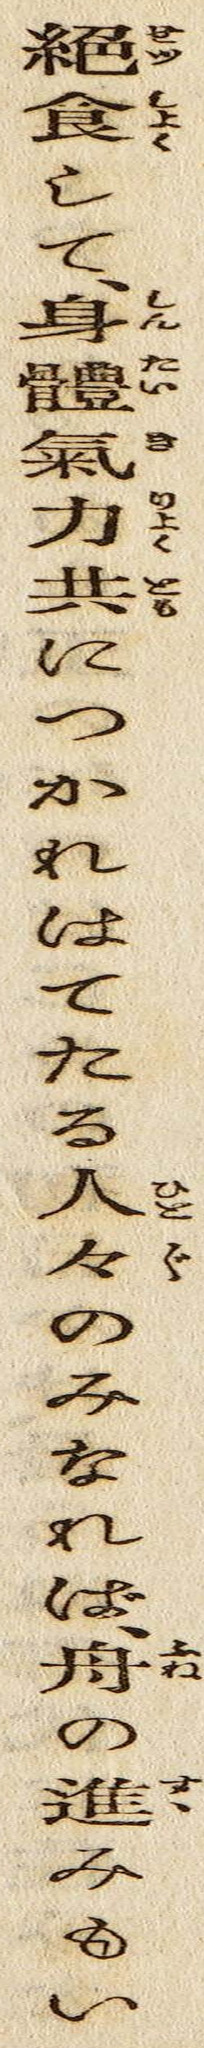絶食して、身体気力共につかれはてたる人々のみなれば、舟の進みもい
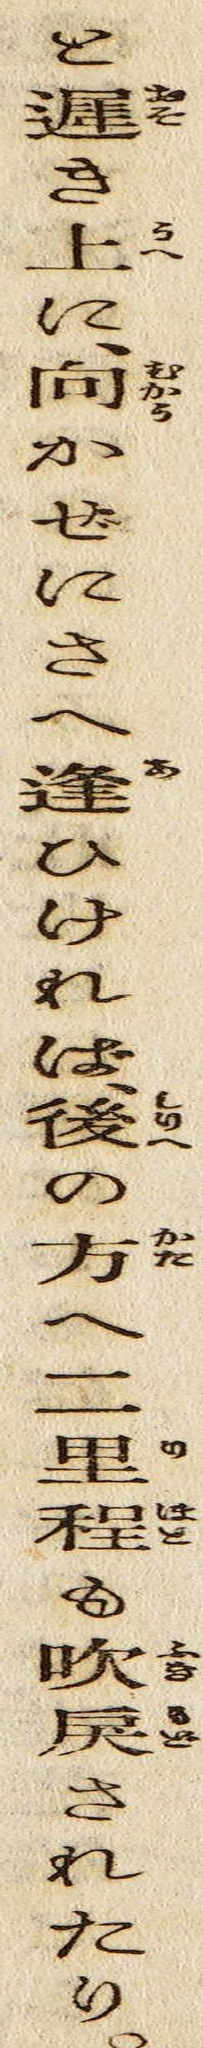と遅き上に、向かぜにさへ逢ひければ、後の方へ二里程も吹戻されたり。
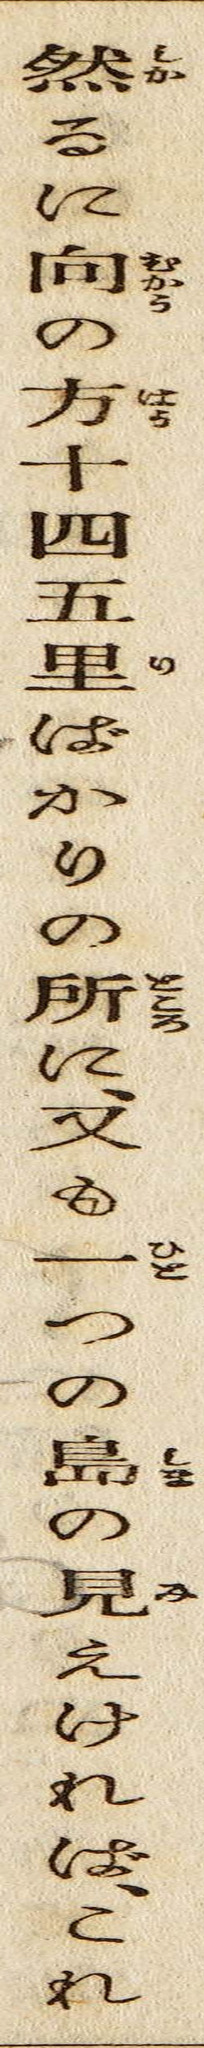然るに向の方十四五里ばかりの所に、又も一つの島の見えければ、これ
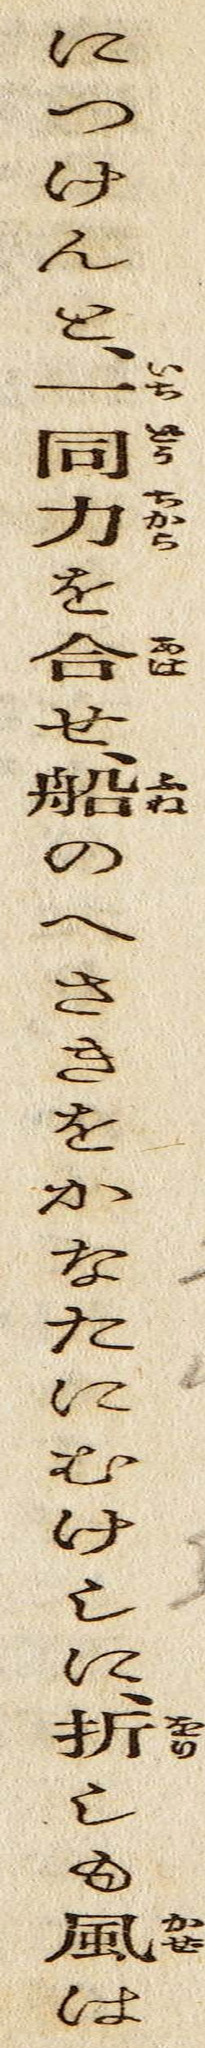につけんと、一同力を合せ、船のへさきをかなたにむけしに、折しも風は
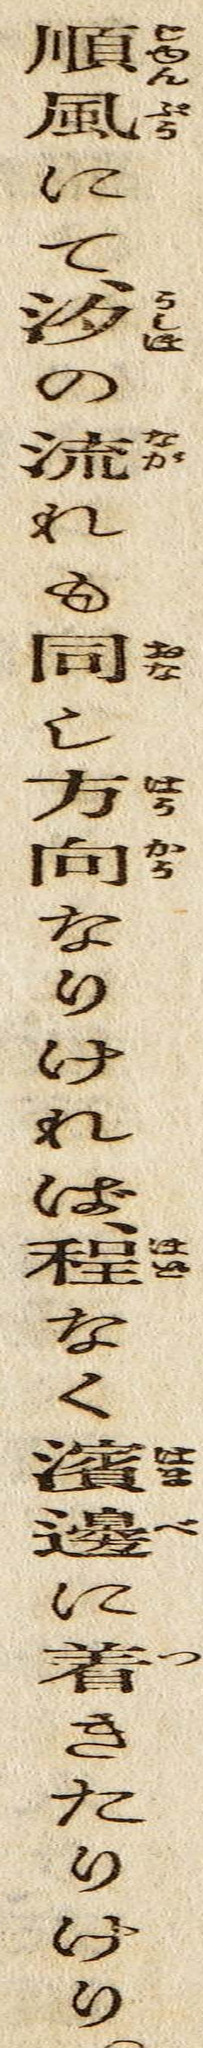順風にて、汐の流れも同し方向なりければ、程なく浜辺に着きたりけり。
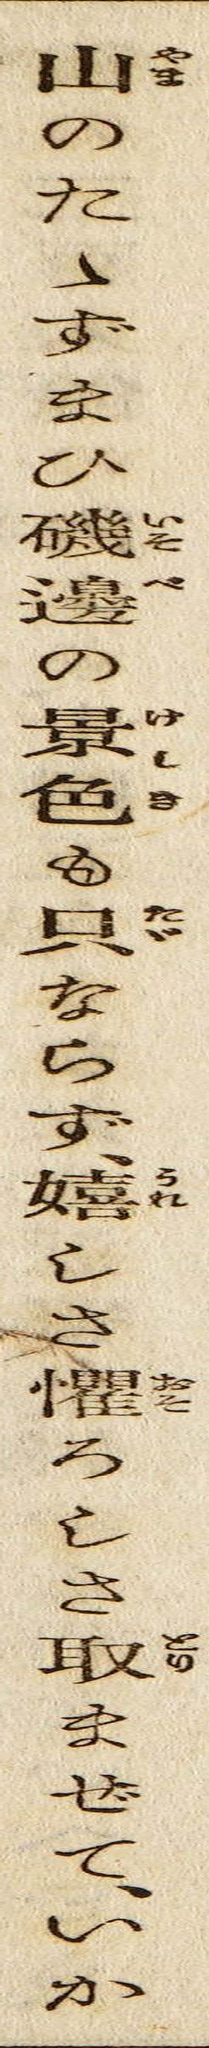山のたゝずまひ磯辺の景色も只ならず、嬉しさ懼ろしさ取まぜて、いか
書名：日本漂流譚
